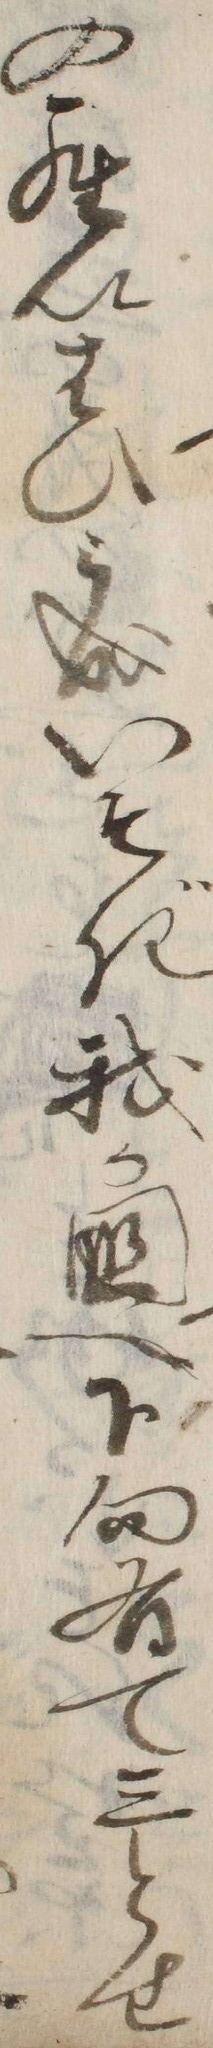のらいはひ被成いそぎ我が国へ下向有て三とせ
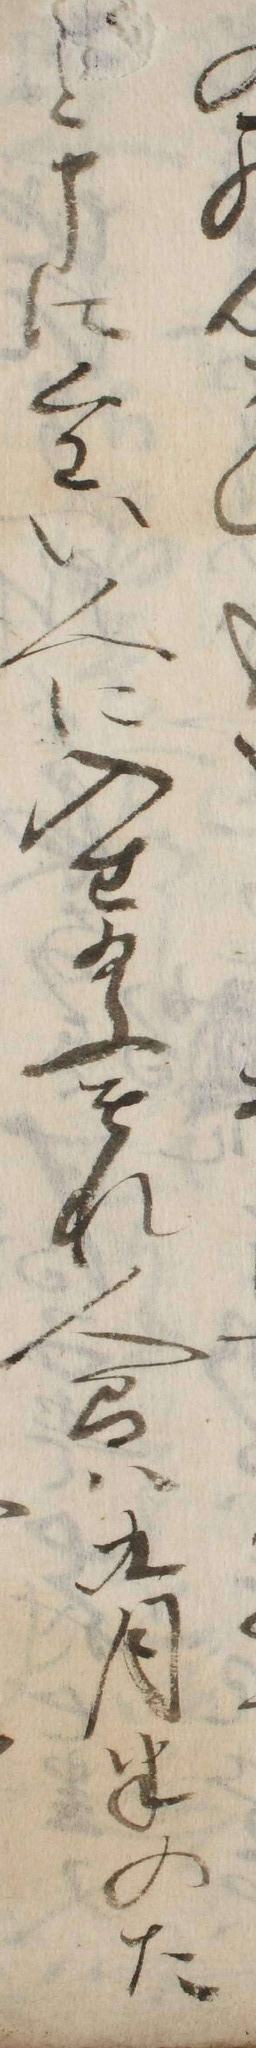と申にくわい人に入せ給ふもれ人間は九月半のた
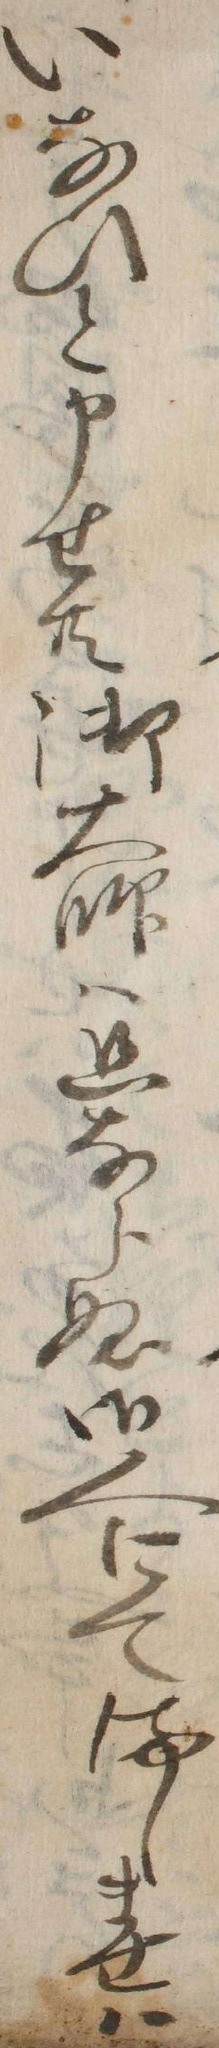いなひと申せ共御大師は旦ならぬ御人にてましませは
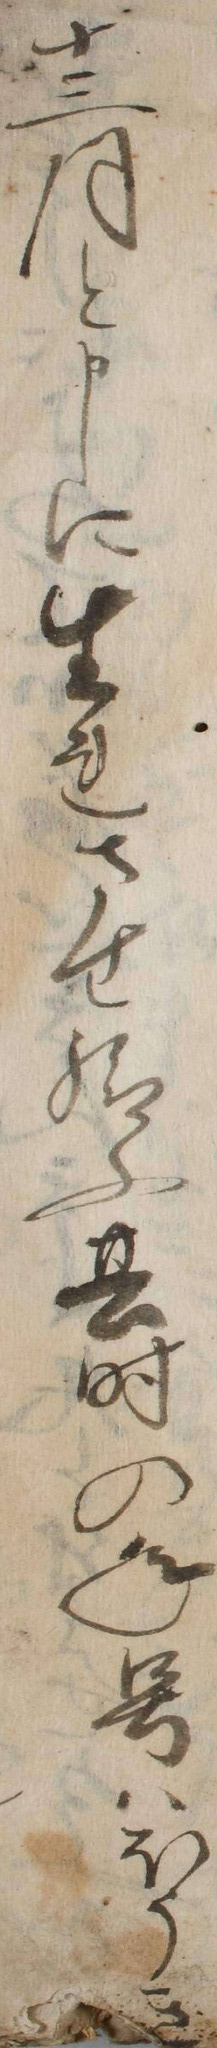十三月と申に生れさせ給ふ其時の年号はほうき
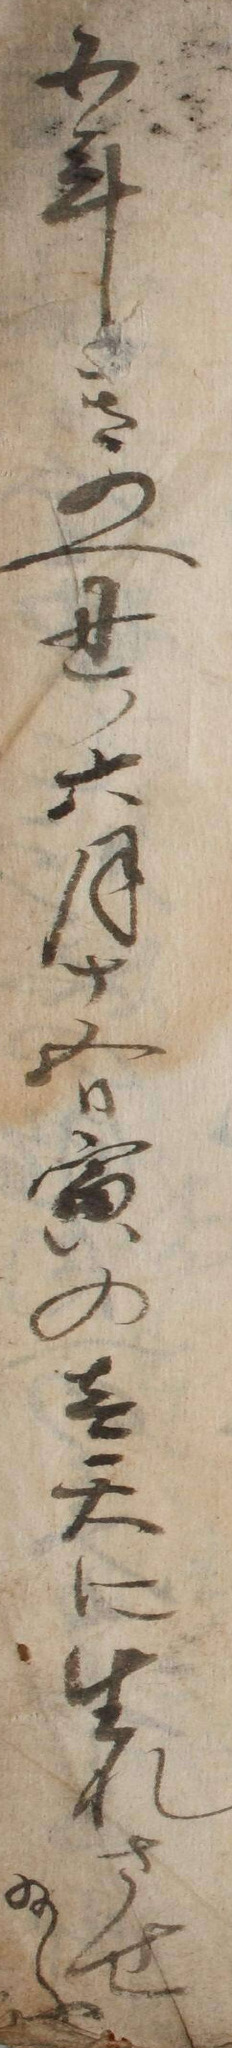五年きのへ丑の六月十五日寅の春天に生れさせ給ふ

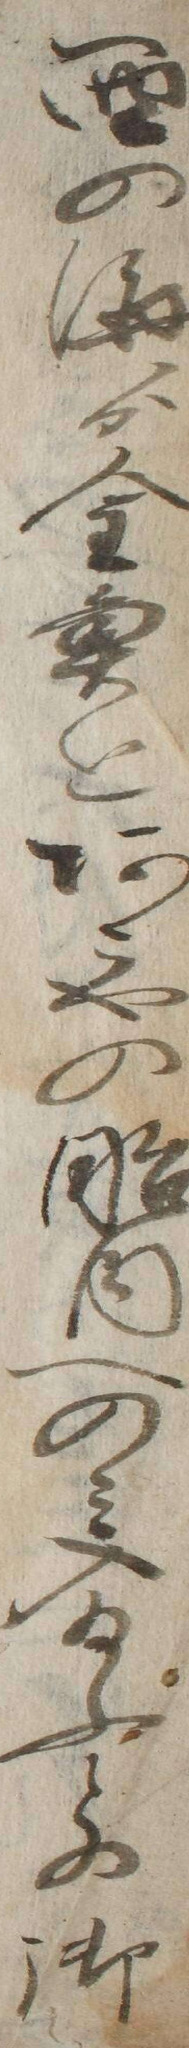西の海より金魚とあこやの胎内へのみ入給ふもの御
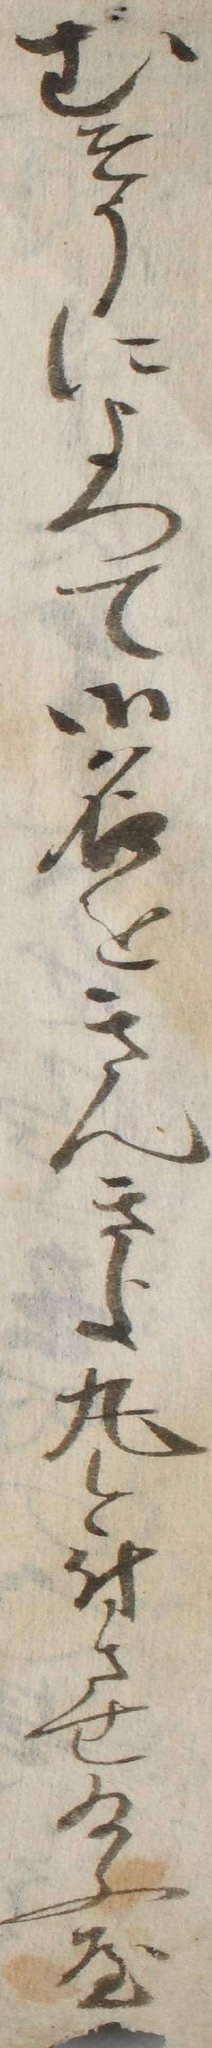むそうによつて御名をきんきよ丸と付させ給ふや
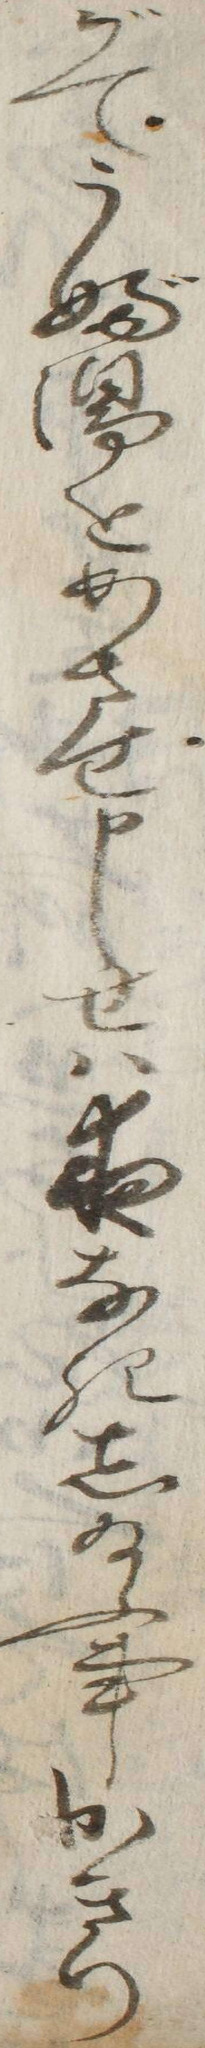がてうぶ湯をめさせ申せは夜なきし給ふ事かきり
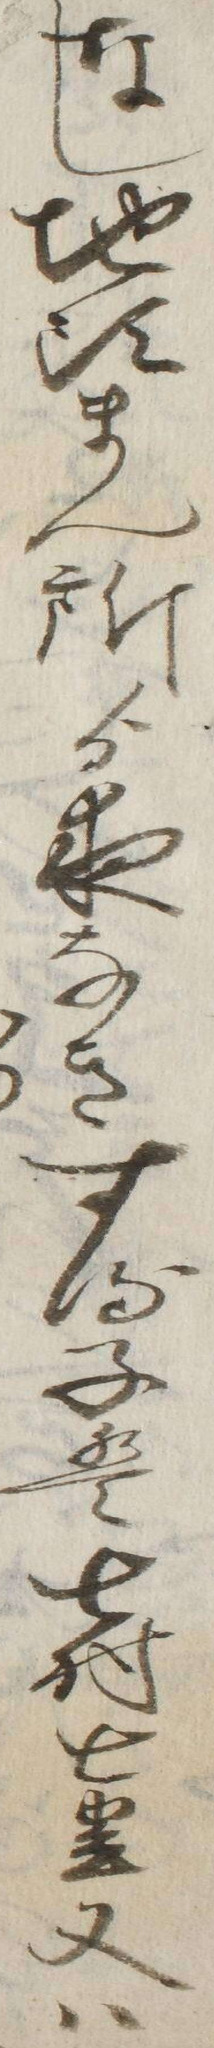なし地頭まん所より夜なきする子は七村七里又は
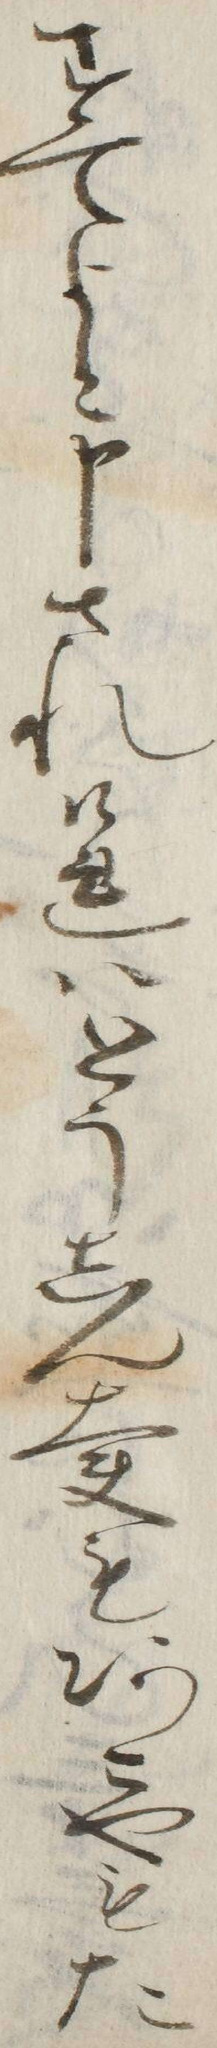さてよと申されけれはとうしん太夫もあこやもた
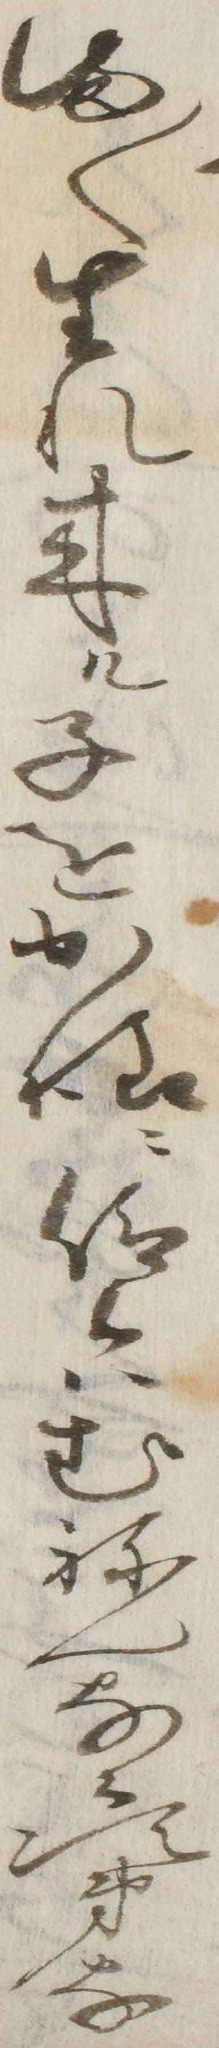ま〳〵生れ来る子をか様に仰候はむねんなる次第な
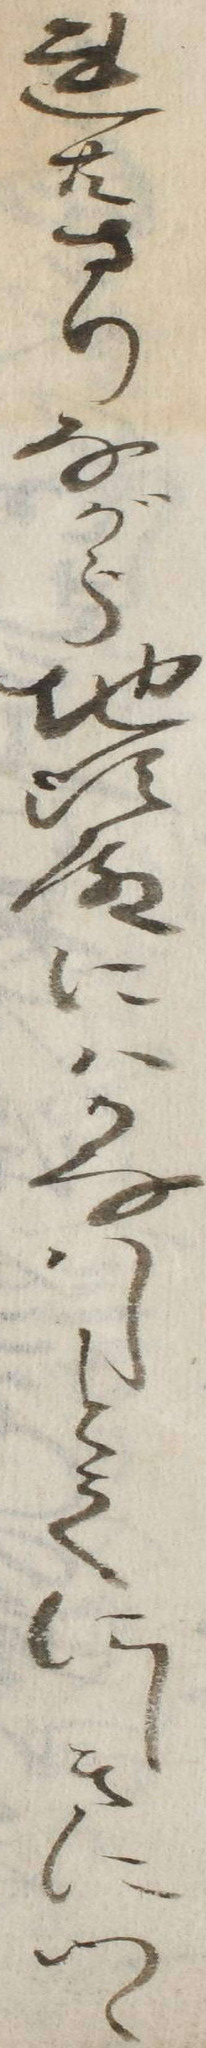れ共さりながら地頭殿にはかなはしとてにしきにつゝ
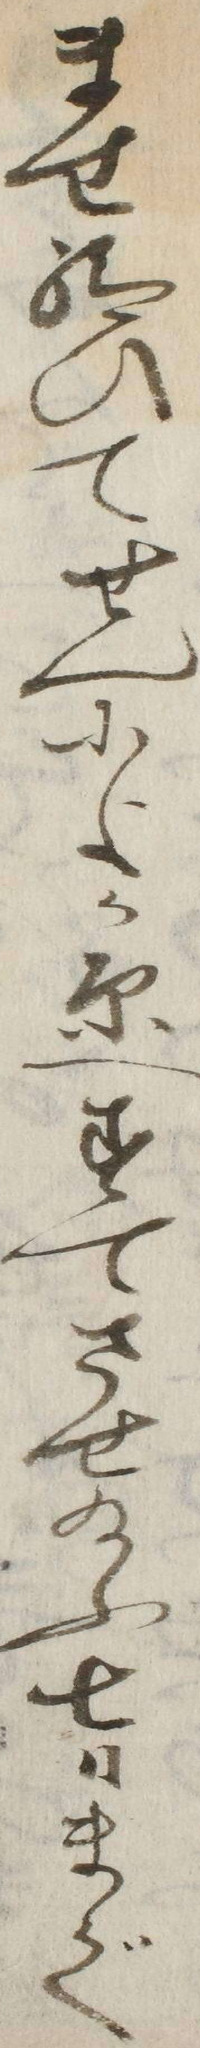ませ給ひてせんによか原へすてさせ給ふ七日まで
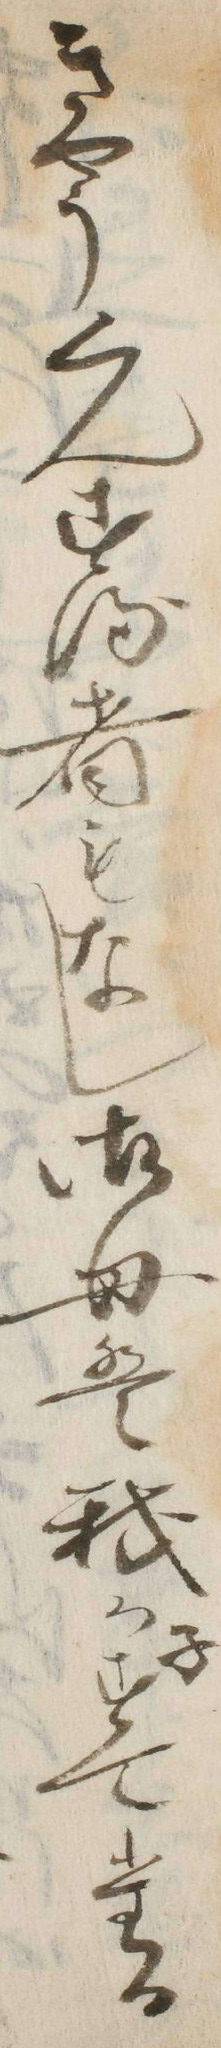きやうくんする者もなし御母は我か子すてたる
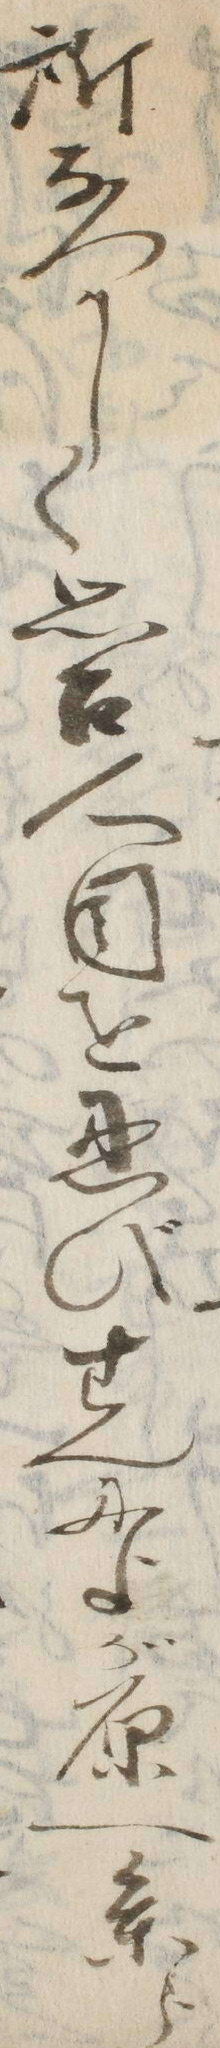所なつかしく思召人目を忍びせんによが原へ参ら
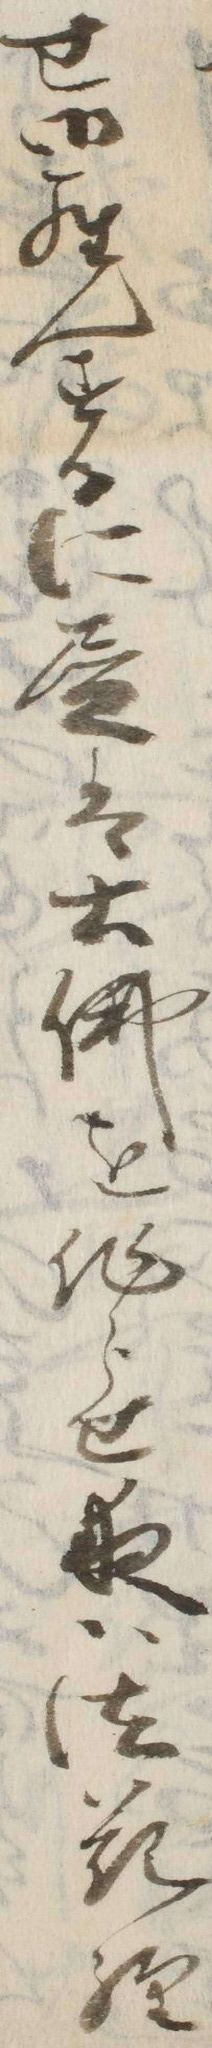せ御らんするに昼は土仏を作らせ夜は法花経
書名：奉弘法大師御傳記
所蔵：国文学研究資料館
